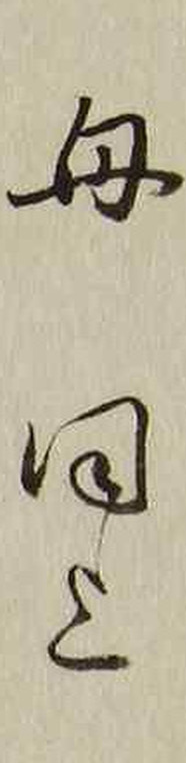母同上
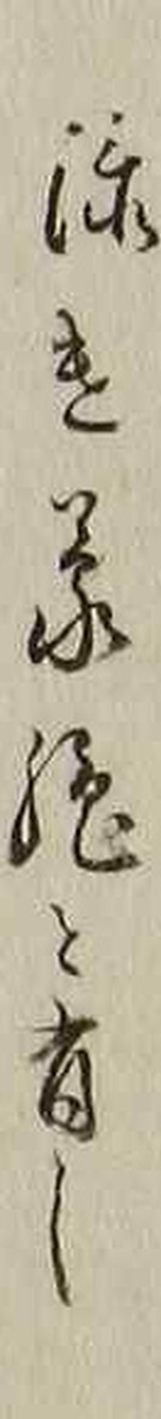添遣義絶と有之
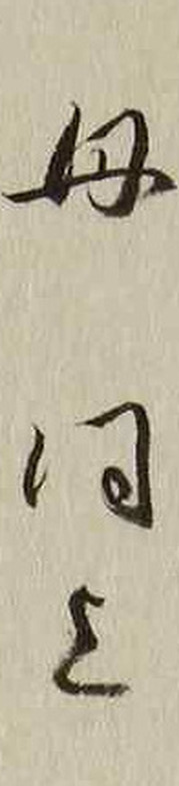母同上
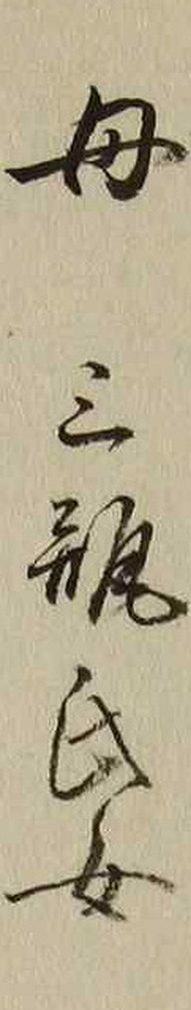母三瓶氏女
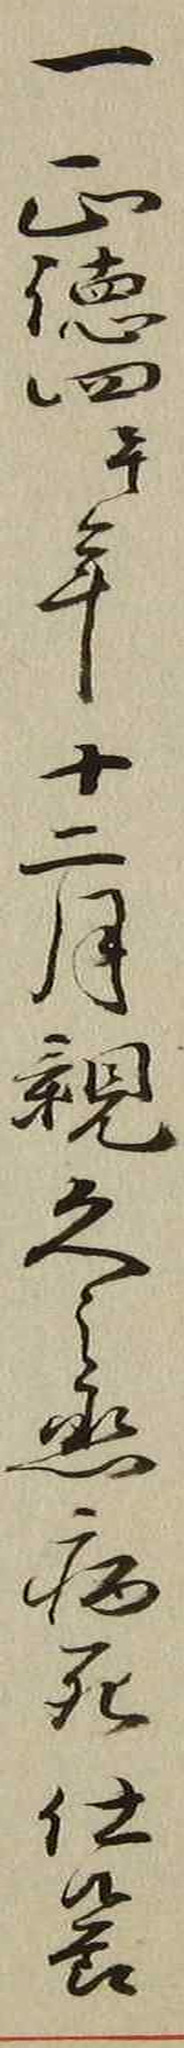一正徳四午年十二月親久之丞病死仕候節
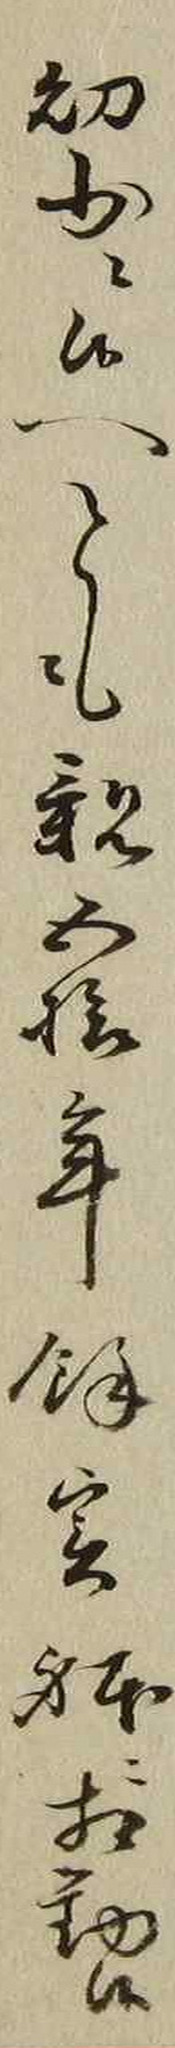幼少ニ候へとも親五拾年余実体ニ相勤候
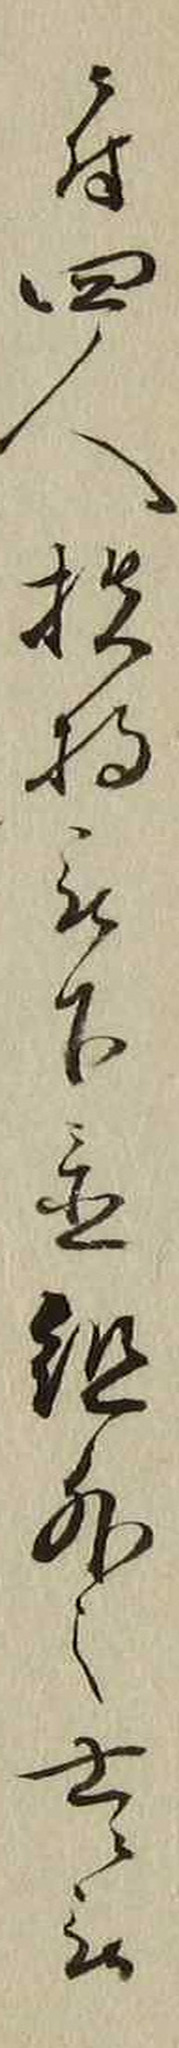ニ付四人扶持被下置組外之士ニ被
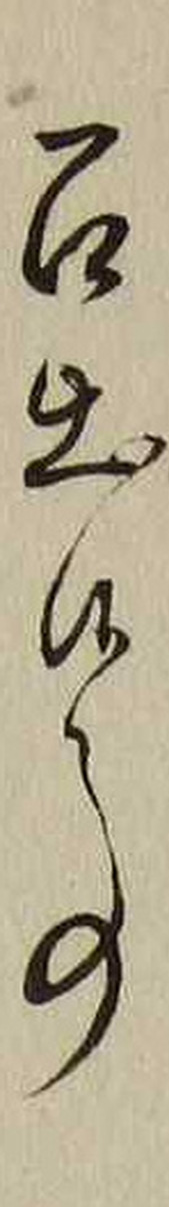召出候事
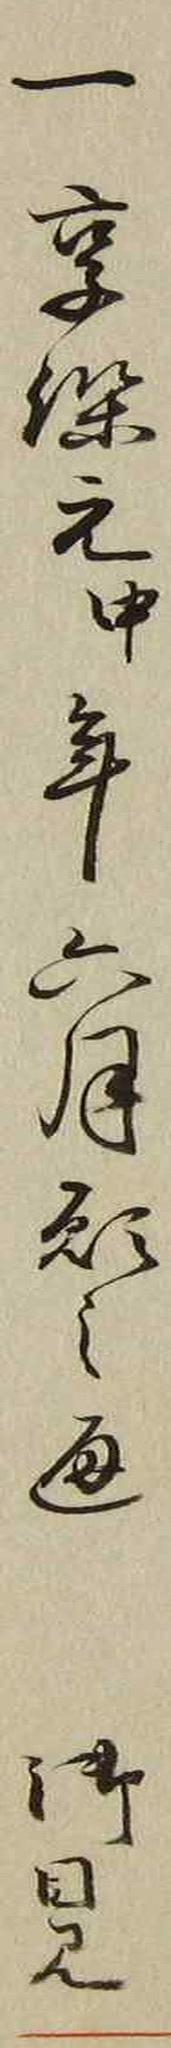一享保元申年六月願之通御目見
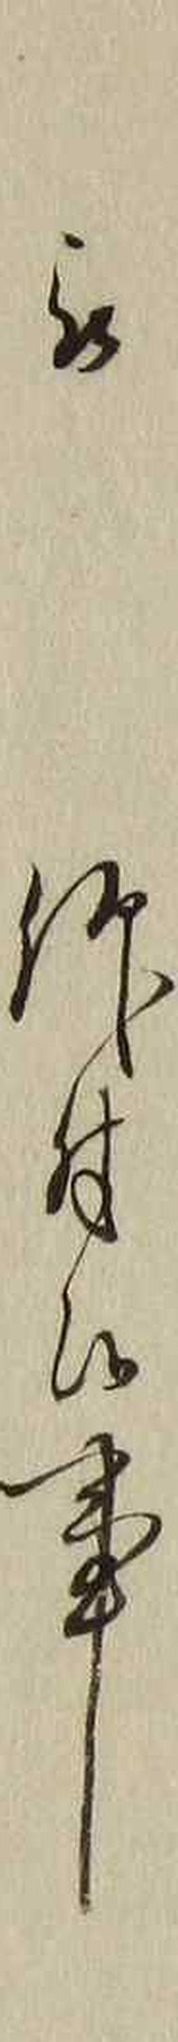被仰付候事
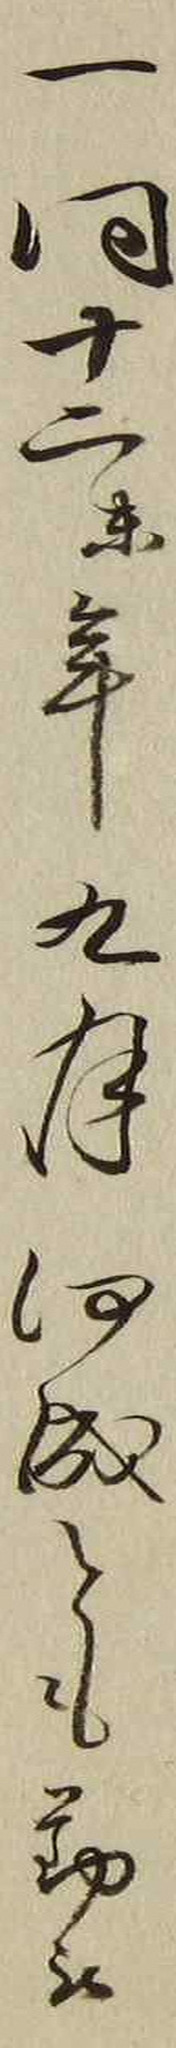一同十二未年九月何成とも勤被
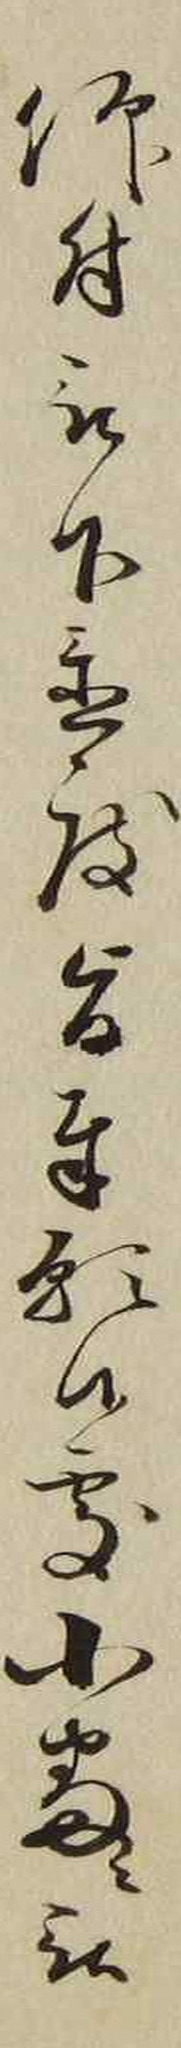仰付被下置度旨奉願候処小番ニ被

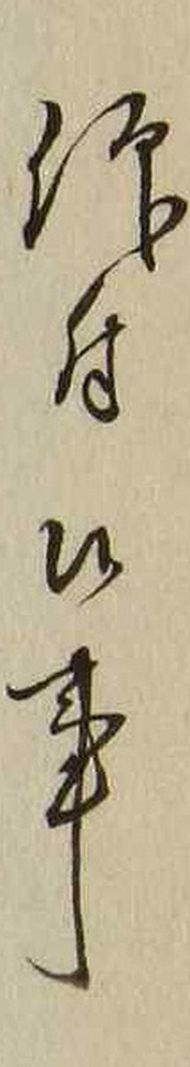仰付候事
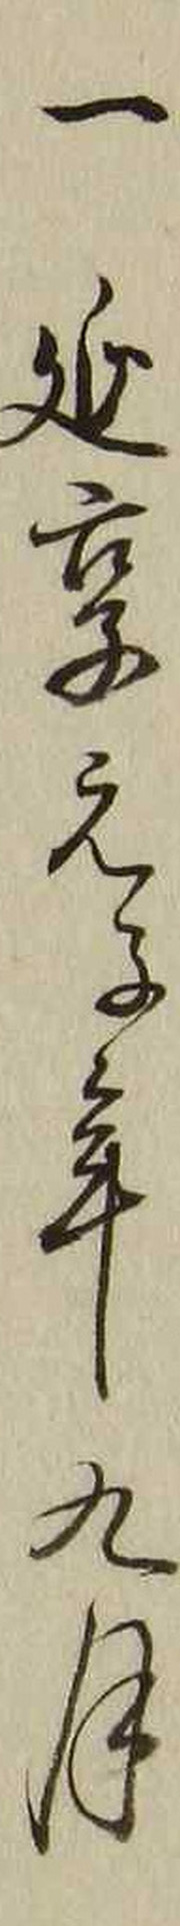一延享元子年九月
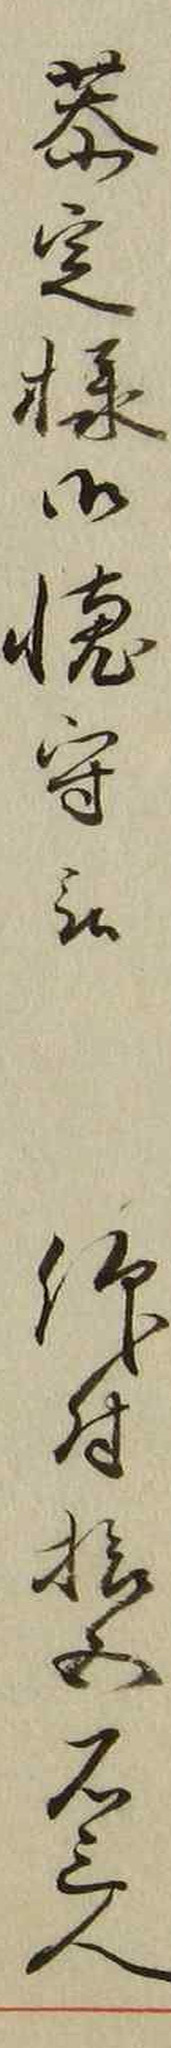恭定様御懐守被仰付拾五石三人
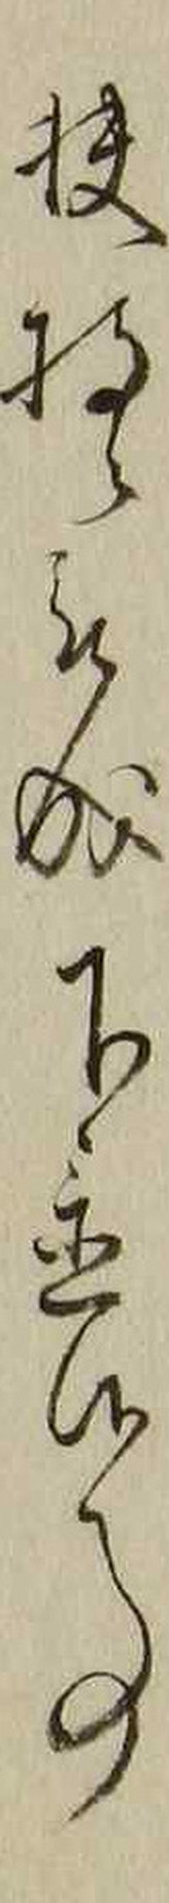扶持ニ被成下置候事
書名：諸士系譜　巻之4　い之部4
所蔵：会津若松市立会津図書館
